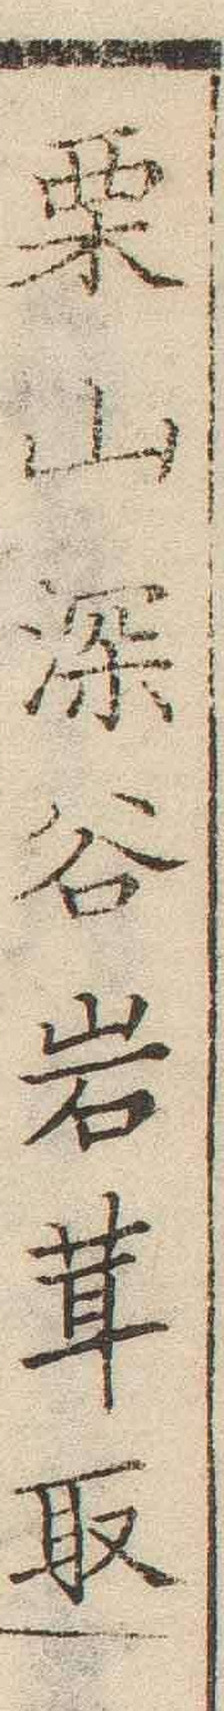栗山深谷岩茸取
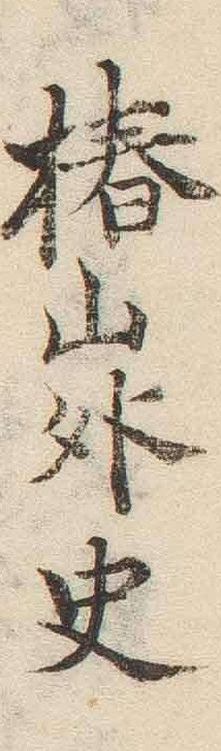椿山外史

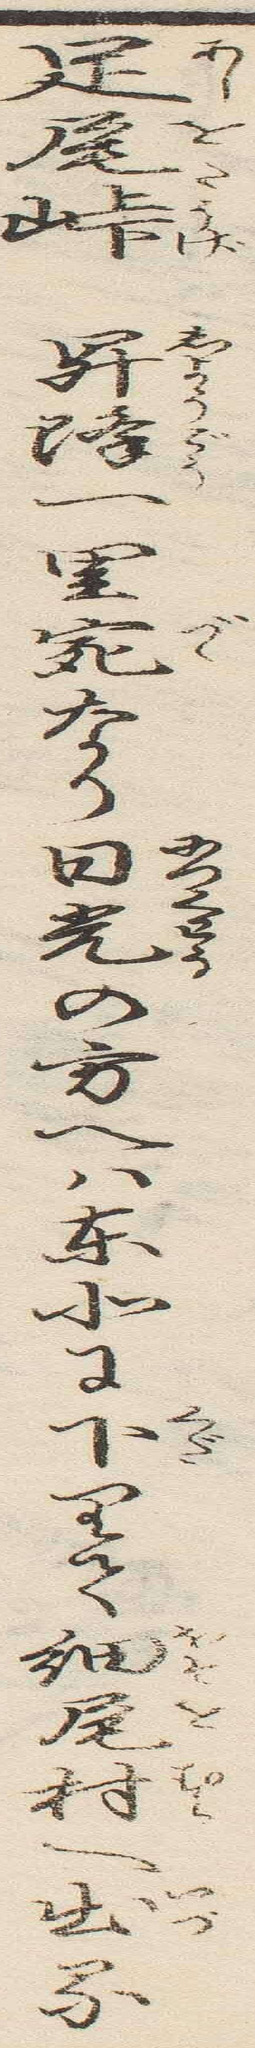足尾峠昇降一里宛なり日光の方へは東北に下りて細尾村へ出る
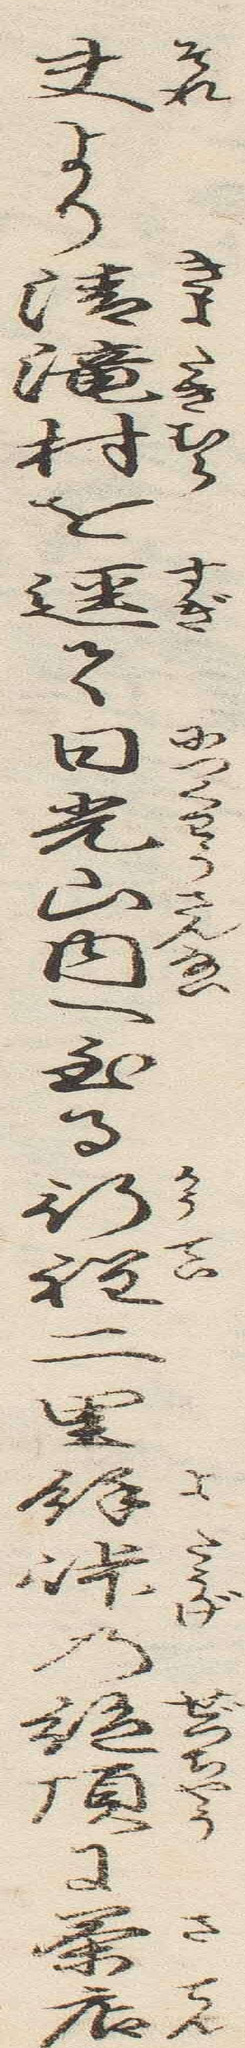夫より清滝村を逕て日光山内へ至る行程二里餘峠の絶頂に茶店
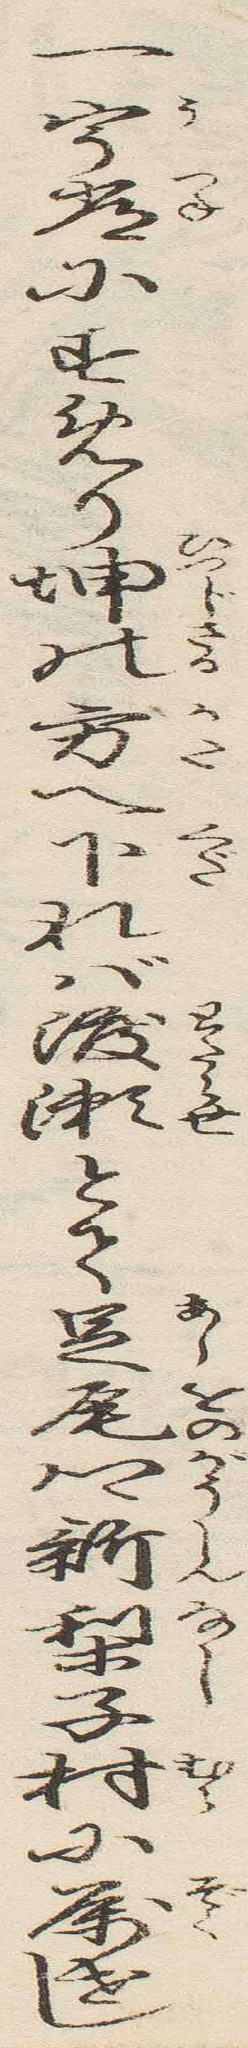一宇常にすめり坤の方へ下れば渡瀬とて足尾郷新梨子村に属せし
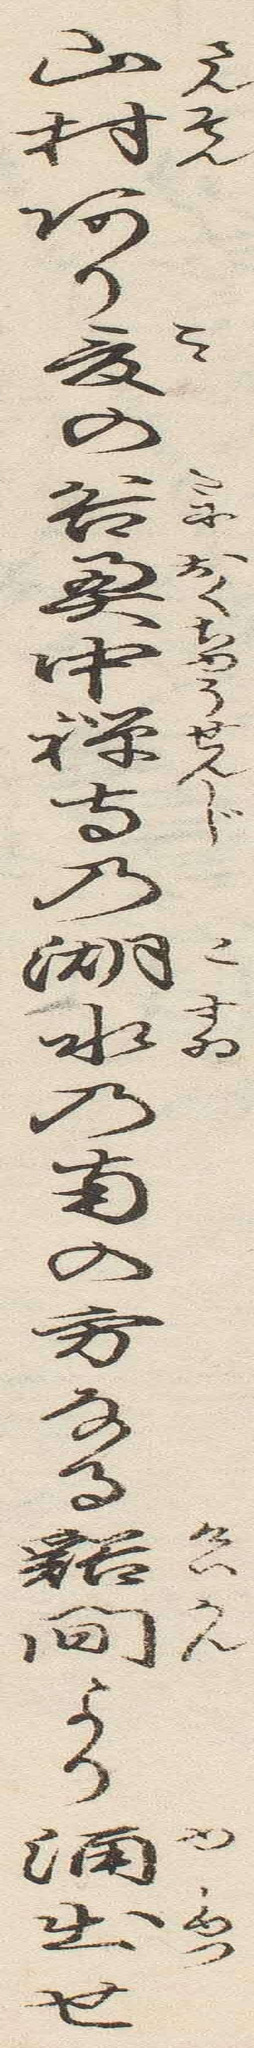山村あり爰の谷奥中禅寺の湖水の南の方なる谿間より涌出せ
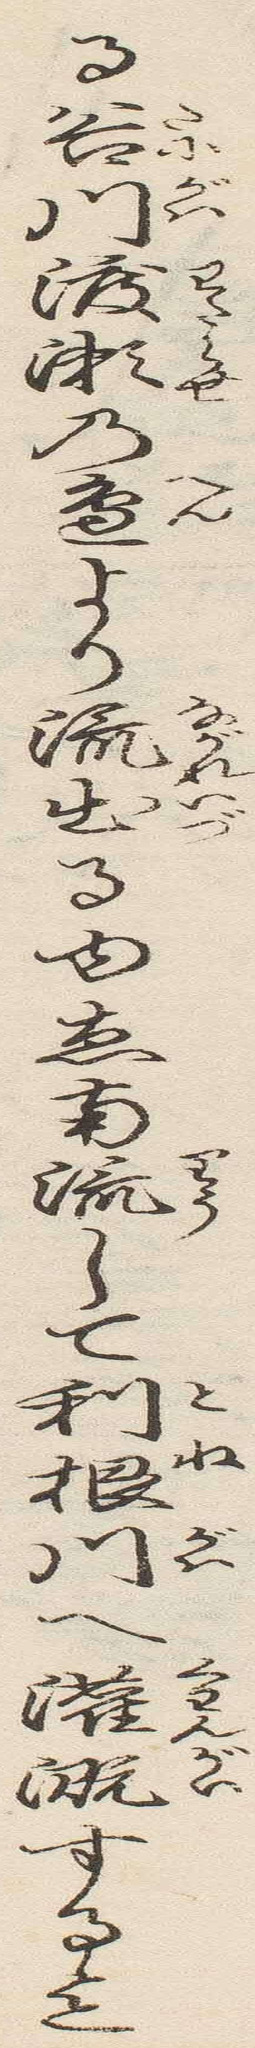る谷川渡瀬の邊より流出るゆゑ南流して利根川へ灌漑する迄
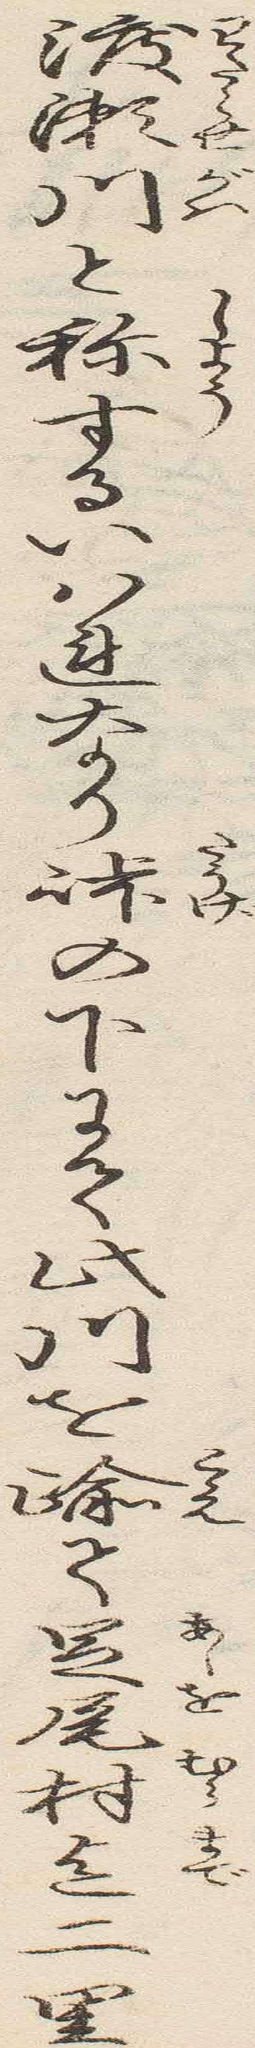渡瀬川と称するいはれなり峠の下にて此川を踰て足尾村迄二里
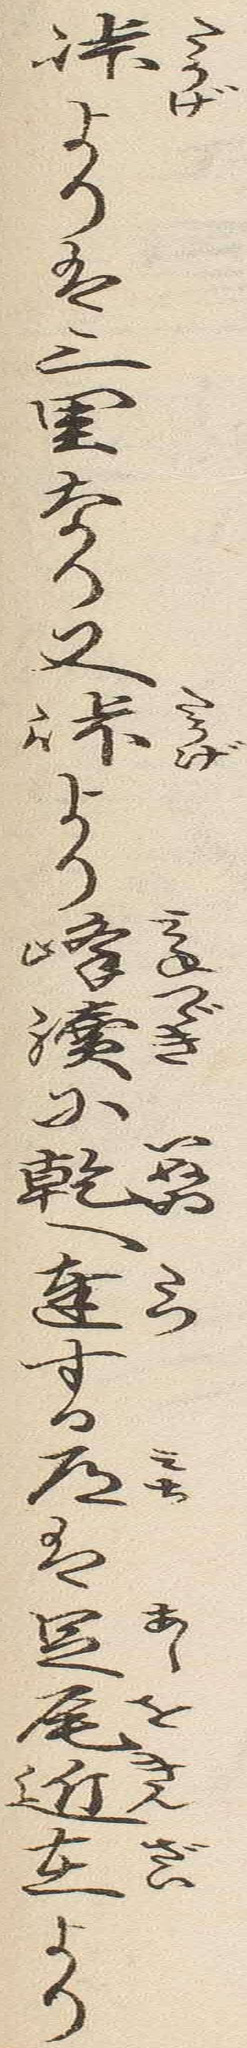峠よりは三里なり又峠より峰續に乾へ達する道は足尾近在より
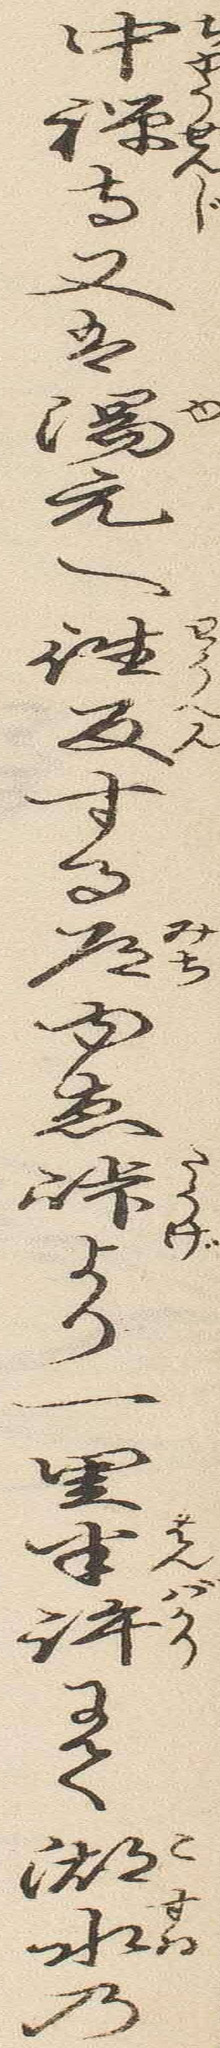中禅寺又は湯元へ徃反する道ゆゑ峠より一里半許にて湖水の
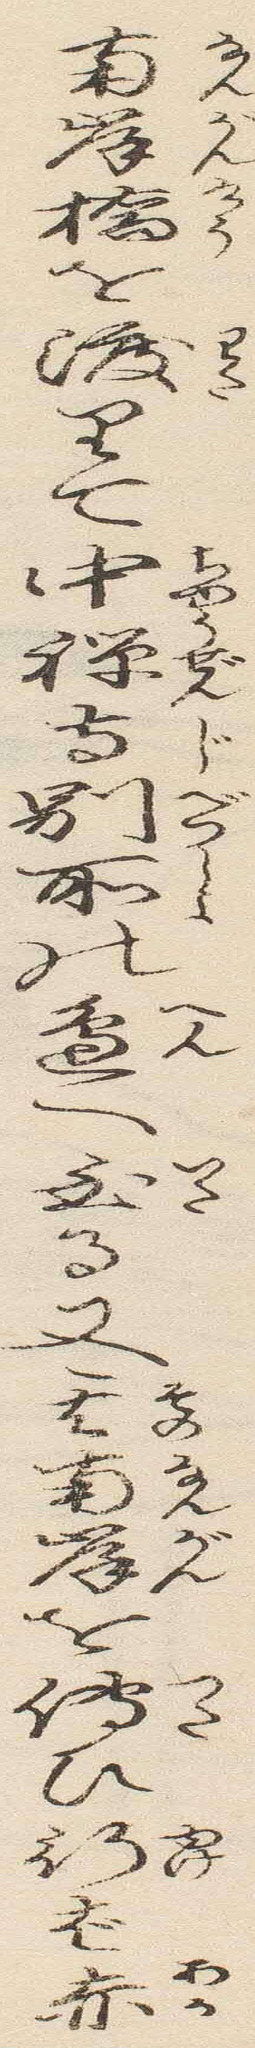南岸橋を渡りて中禅寺別所の邊へ至る又其南岸を傳ひ行ば赤
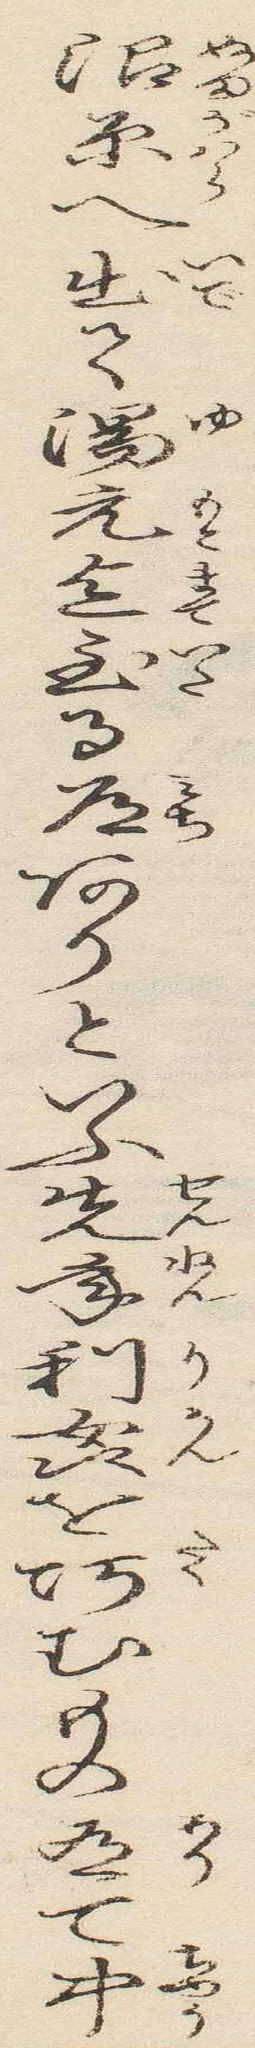沼原へ出て湯元迄至る道ありといふ先年利姦を巧むもの有て中
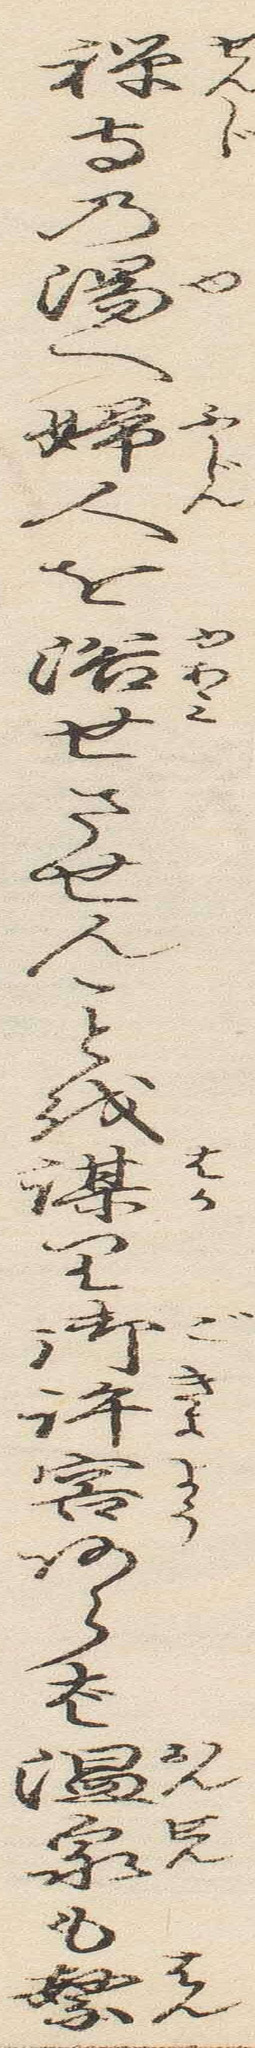禅寺の湯へ婦人を浴せさせんことを謀り御許容あらば温泉も繁
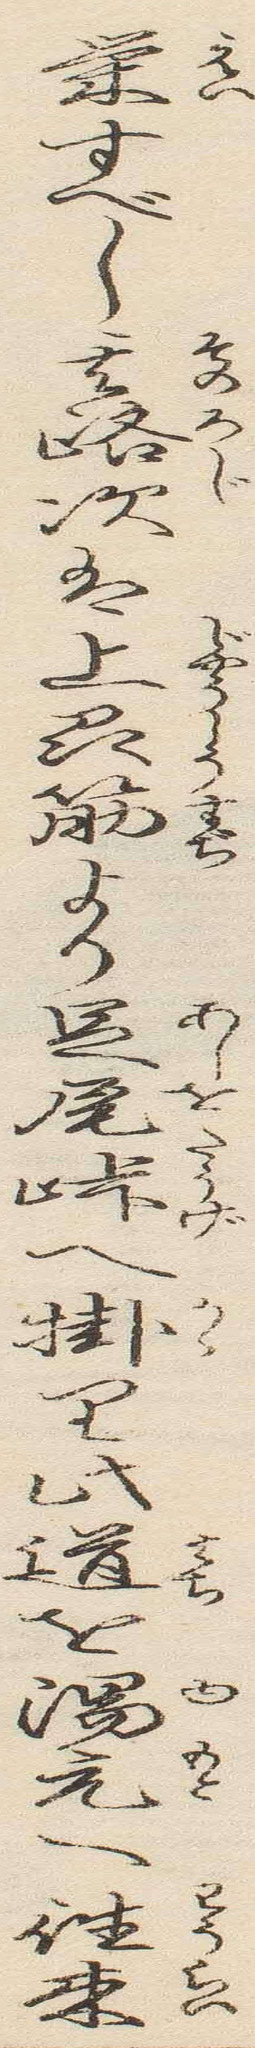栄すべし其路次は上刕筋より足尾峠へ掛り此道を湯元へ徃來
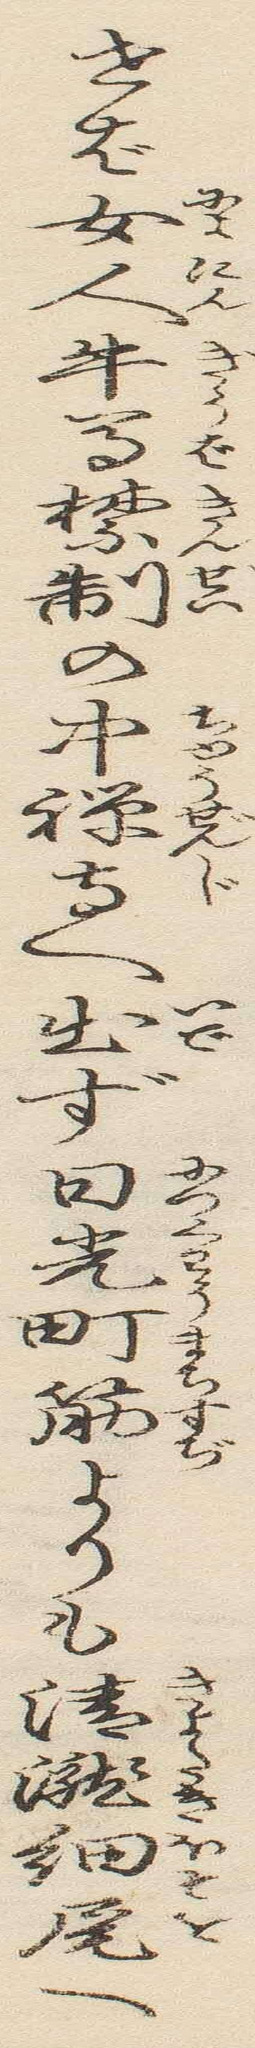せば女人牛馬禁制の中禅寺へ出ず日光町筋よりも清瀧細尾へ
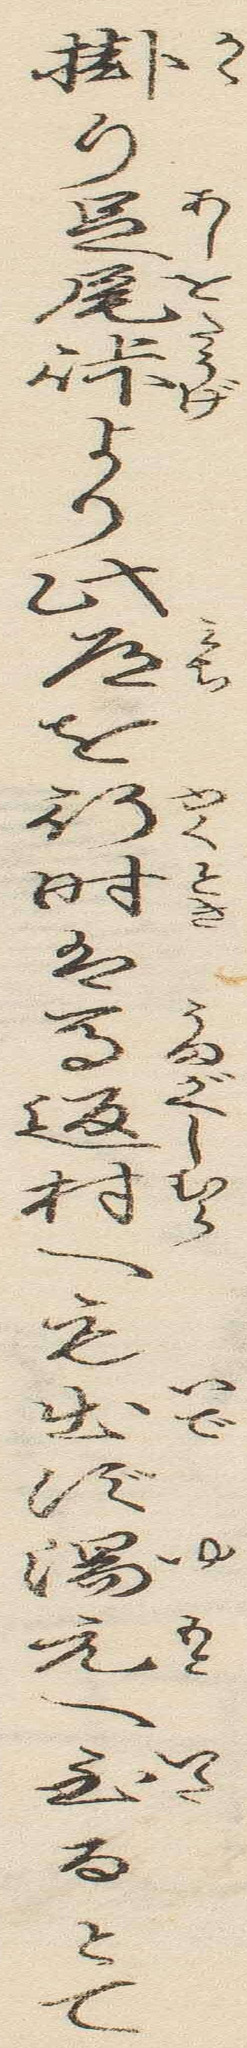掛り足尾峠より此道を行时は馬返村へも出ず湯元へ至るとて
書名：日光山志
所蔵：東京学芸大学附属図書館 国文学研究資料館
